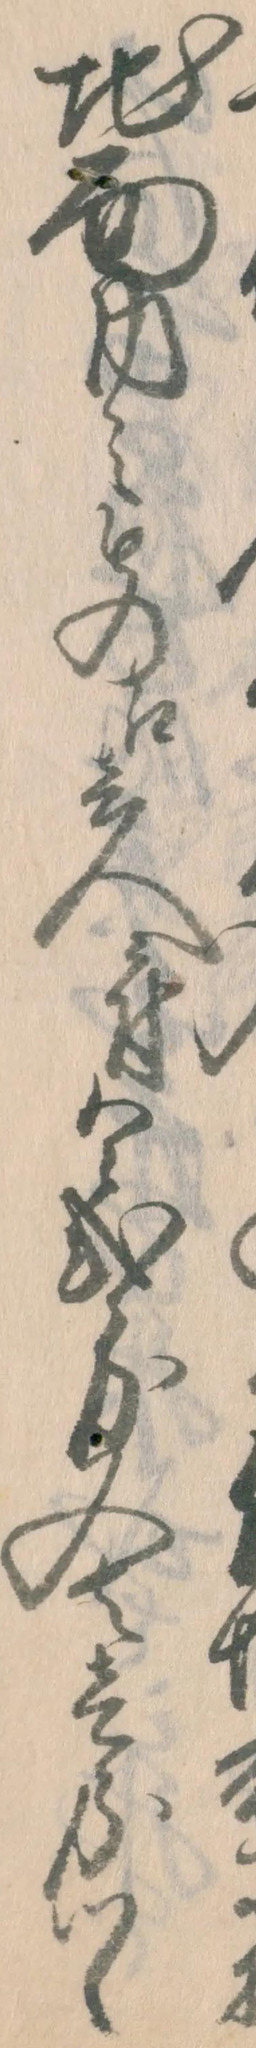地面内之ものえ壱人ニ付金弐分又は壱分ツヽ

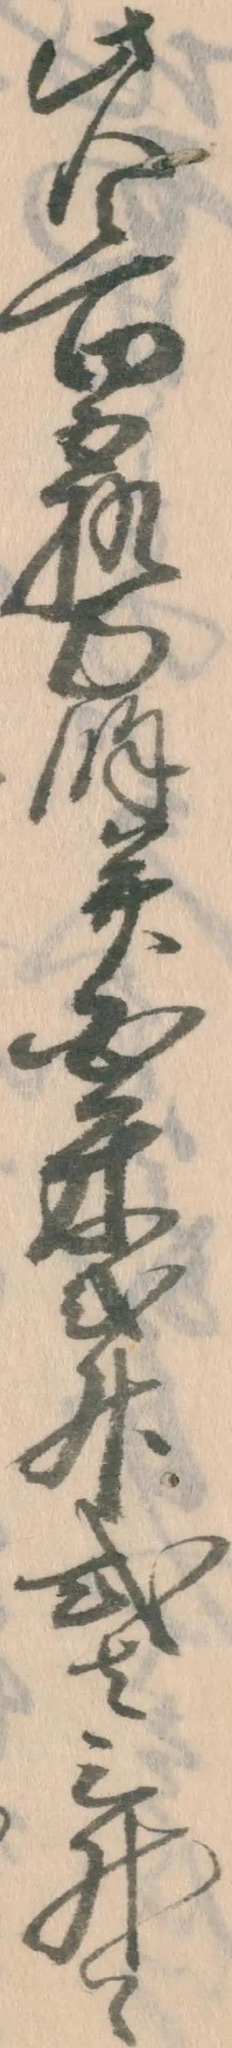此金百五拾両余并白米弐升或は三升ツヽ
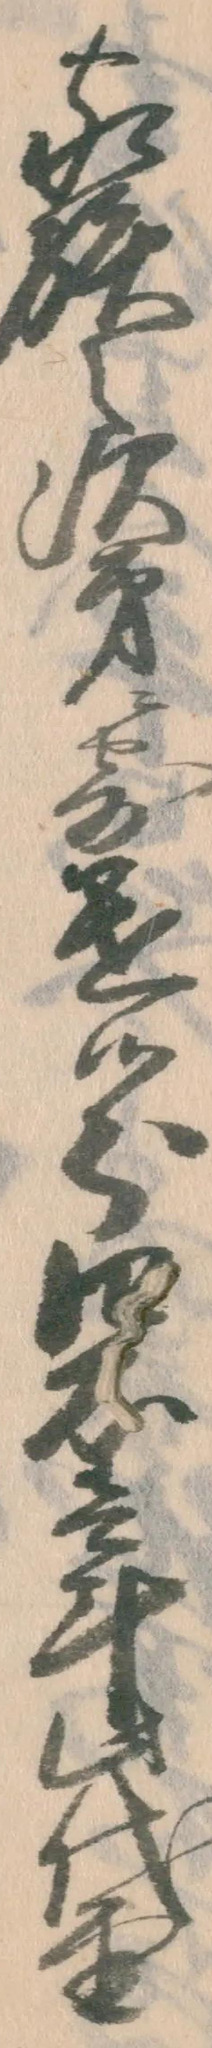家族之次第ニ寄遣候分四石壱斗此代金
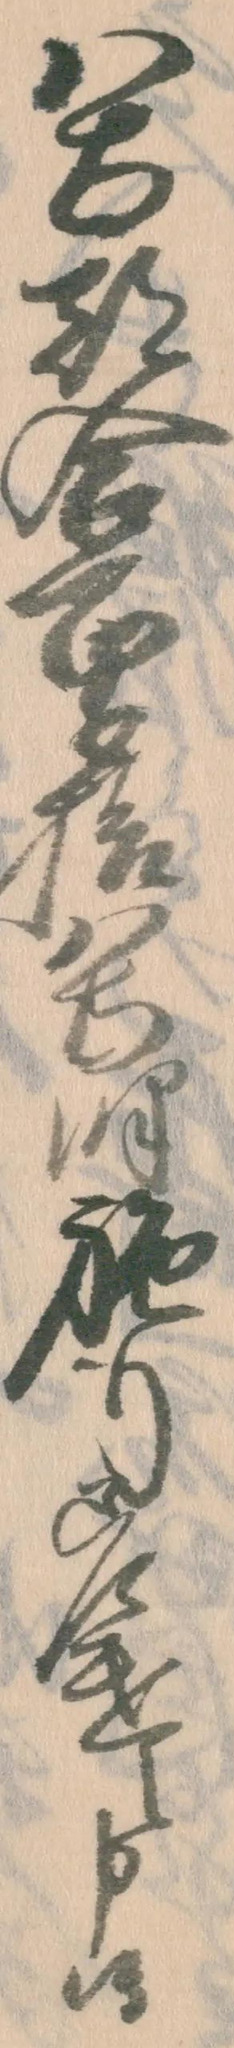八両都合百五拾八両余施行差遣し申候
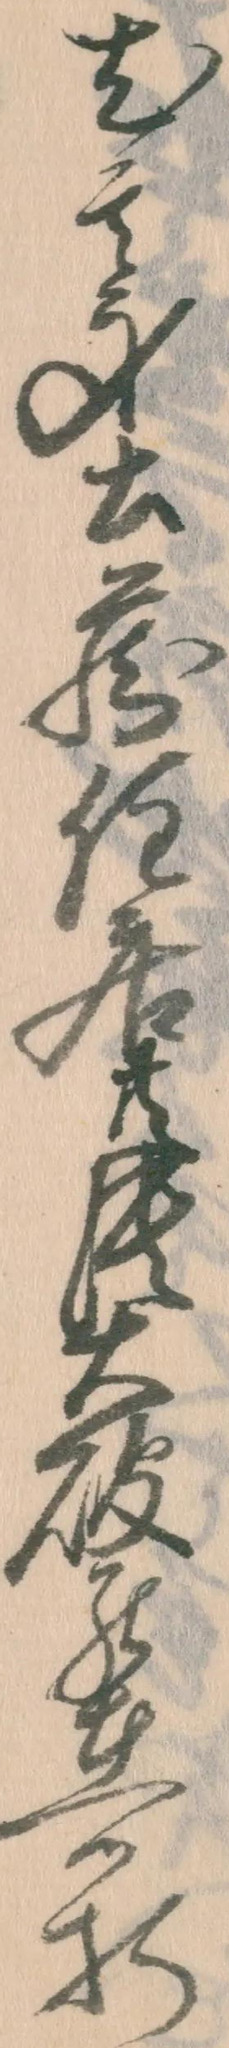尤其身土蔵住居共潰大破罷在候折
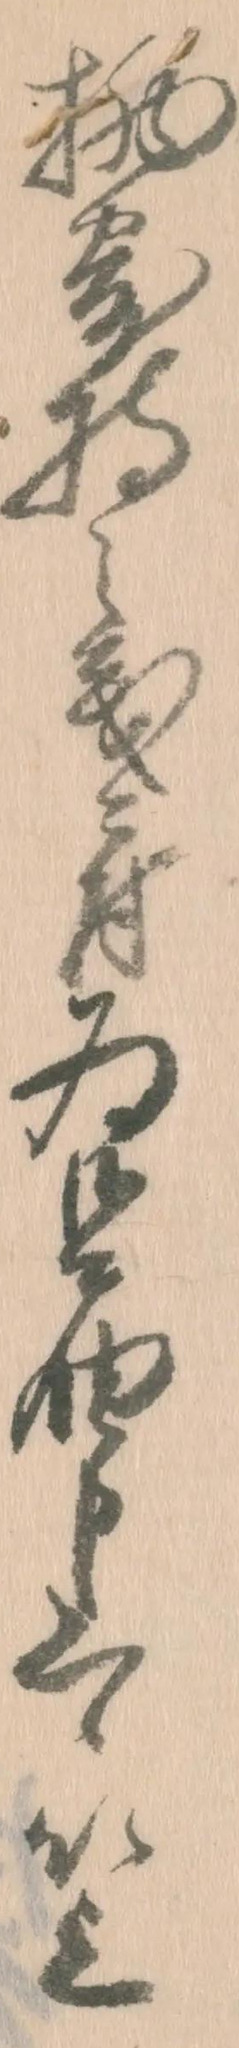柄奇特之義ニ付為御届申上候以上
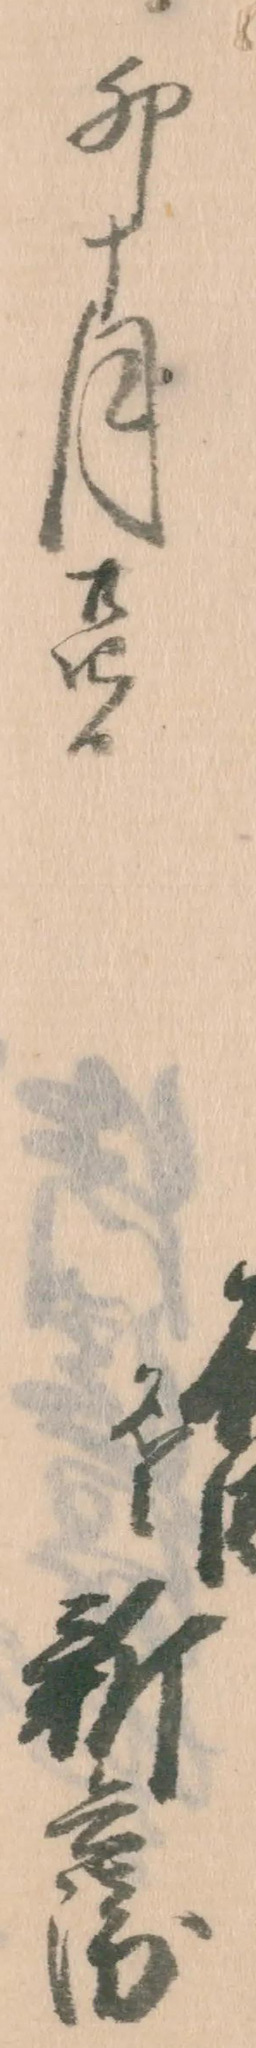卯十月廿四日名主新兵衛
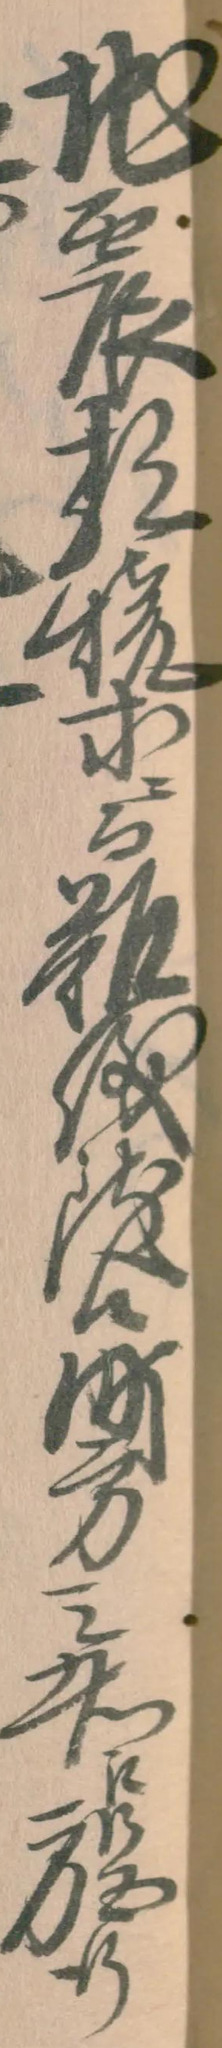地震類焼等ニ而難儀致候町方之者え施行
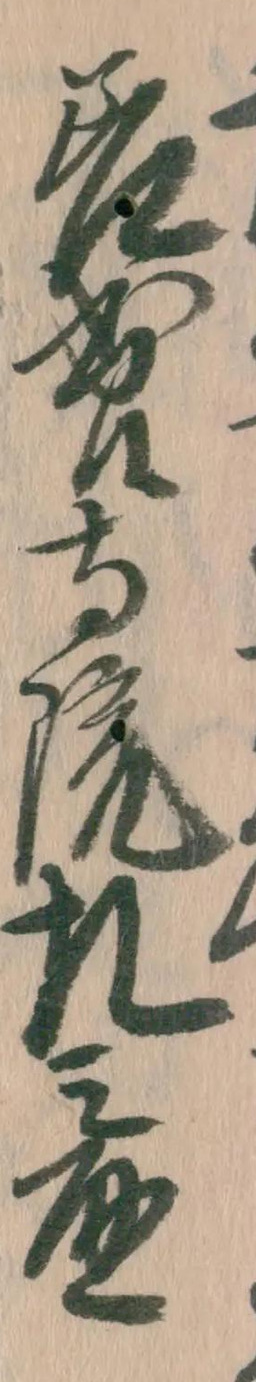差出候寺院左之通
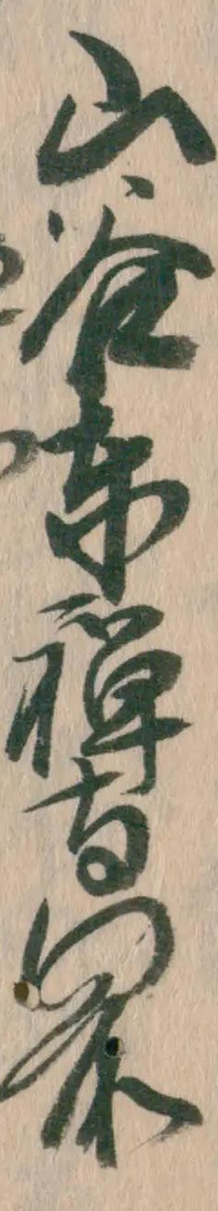山谷東禅寺門前
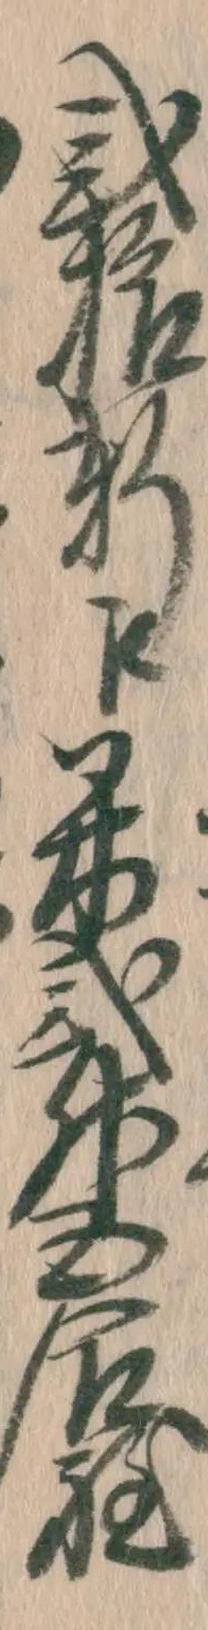弐拾軒え米弐升五合程
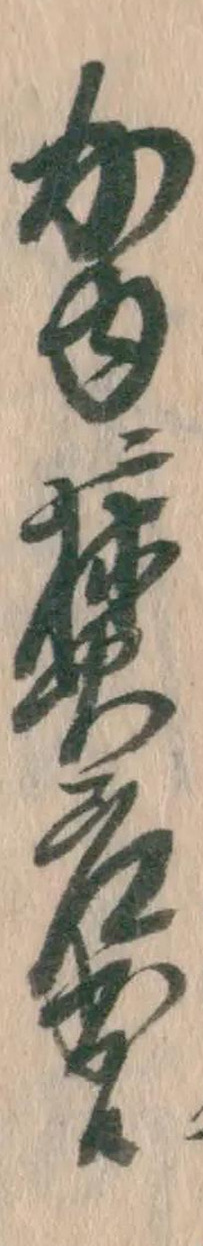かゆニ焚差出候
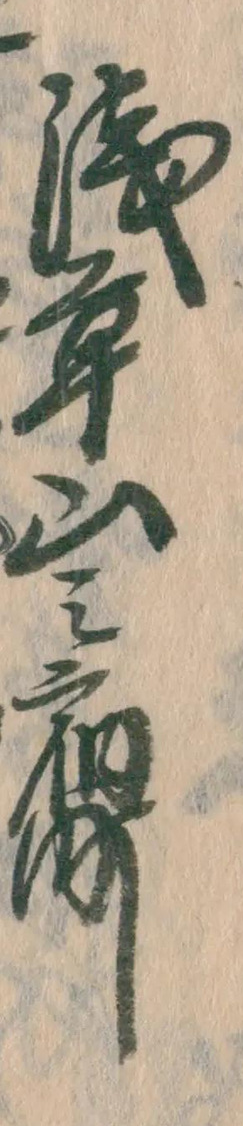浅草山之宿町
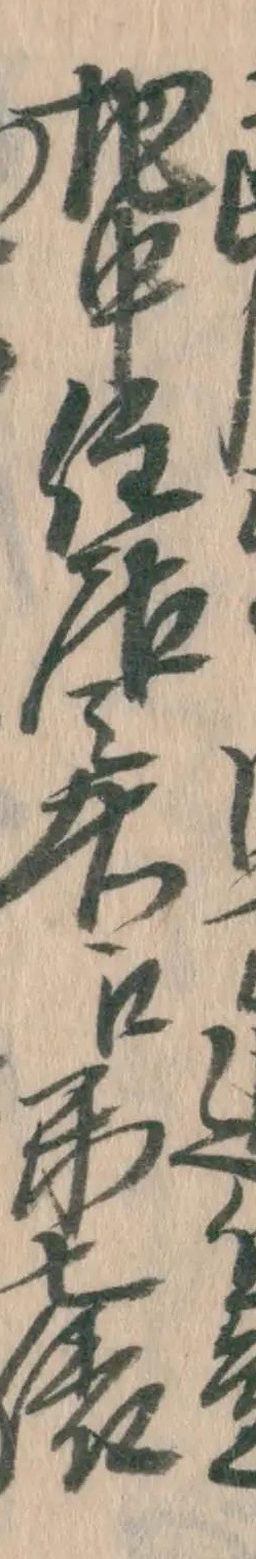地中住居之者え米七俵
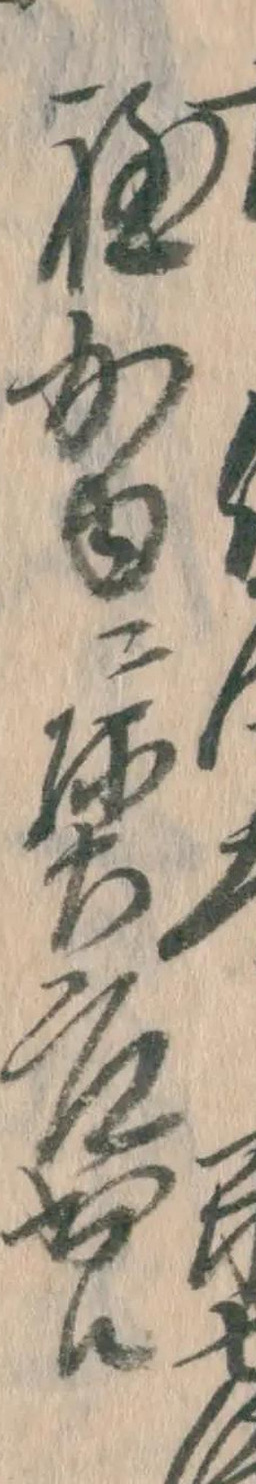程かゆニ焚差出候

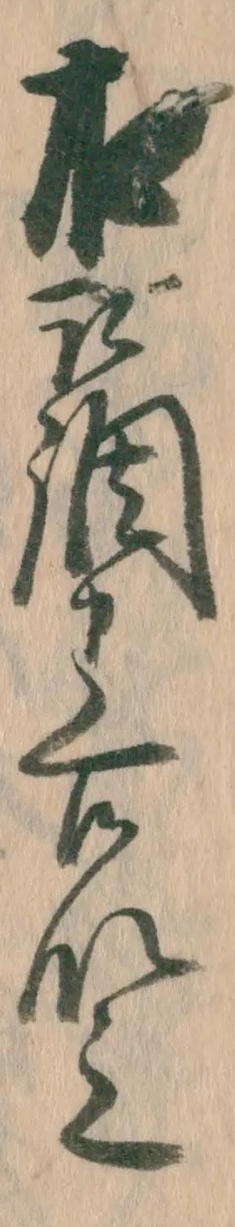右取調申上候以上
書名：武家方并寺院等ニテ施差出候一件
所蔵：国立国会図書館 National Diet Library, JAPAN
